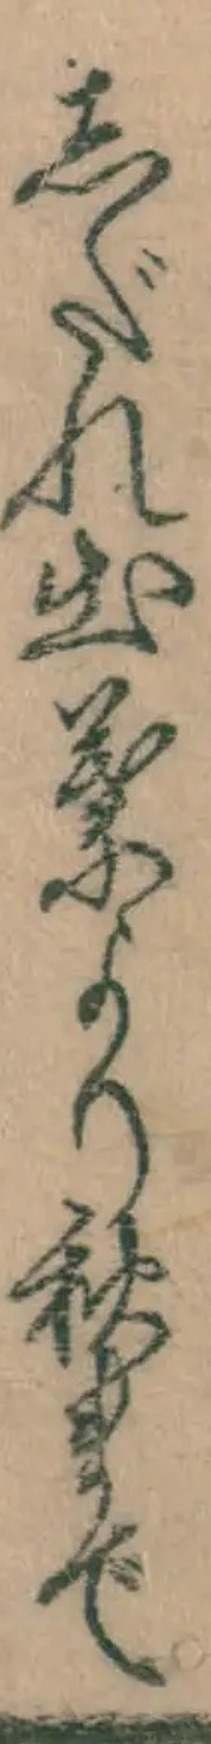しだれ出葉より秋まで
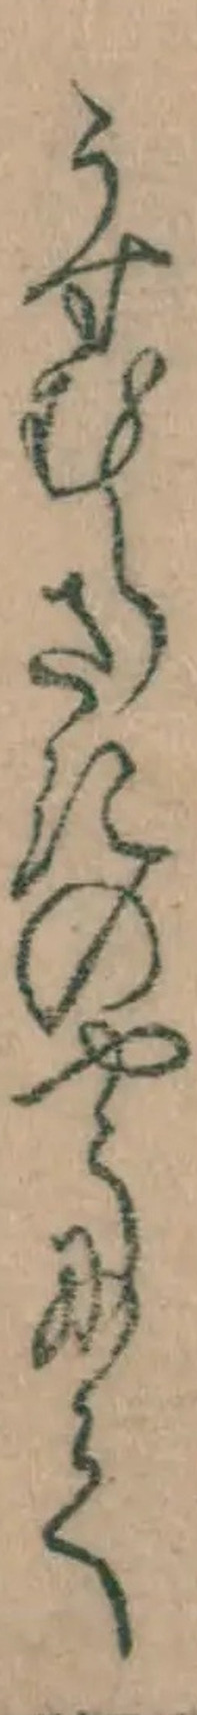うすむらさきのやうにて
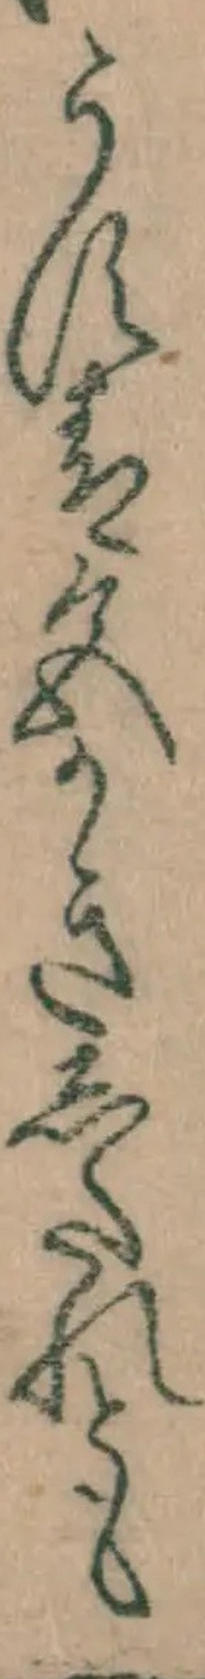うす青色かきしたれとも
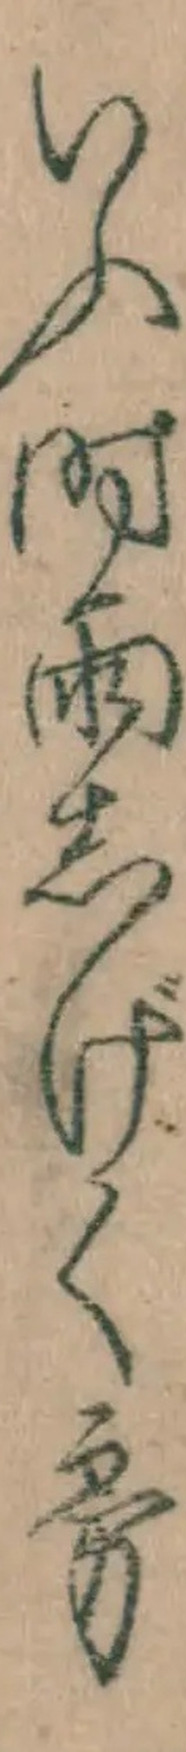いふ時雨しげく霧
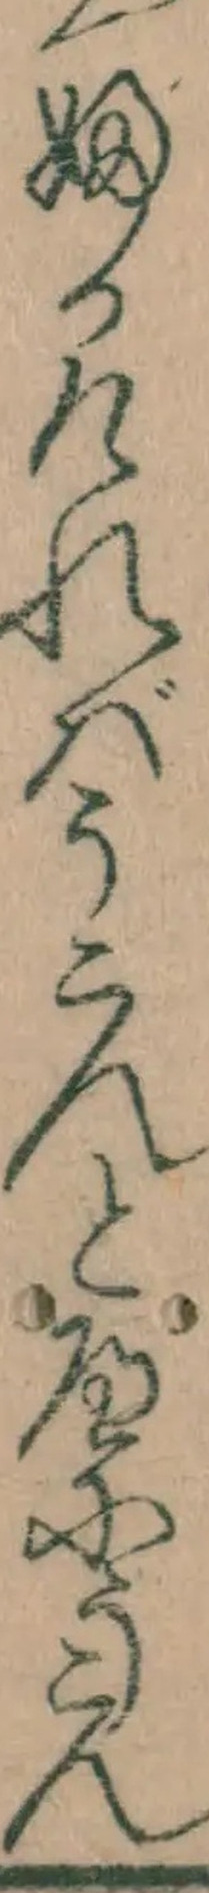ふかければうこんとへにうこん
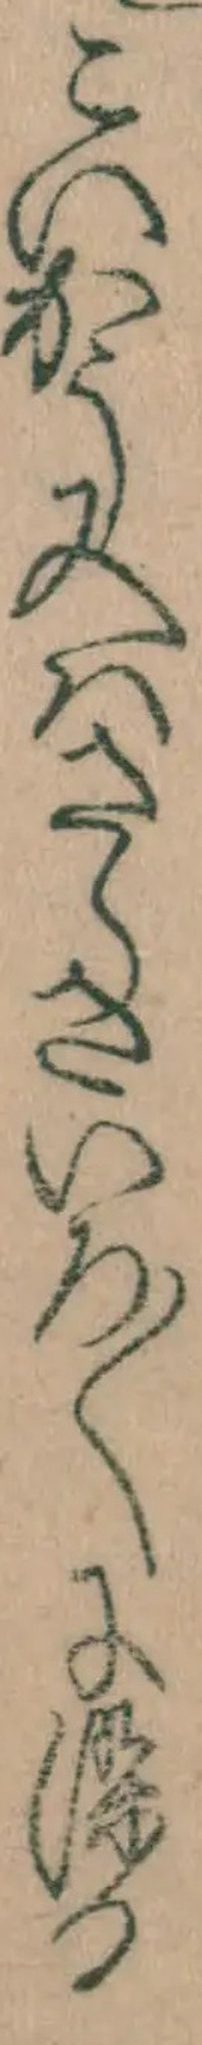こいかう又はさくきいろ〳〵に染る
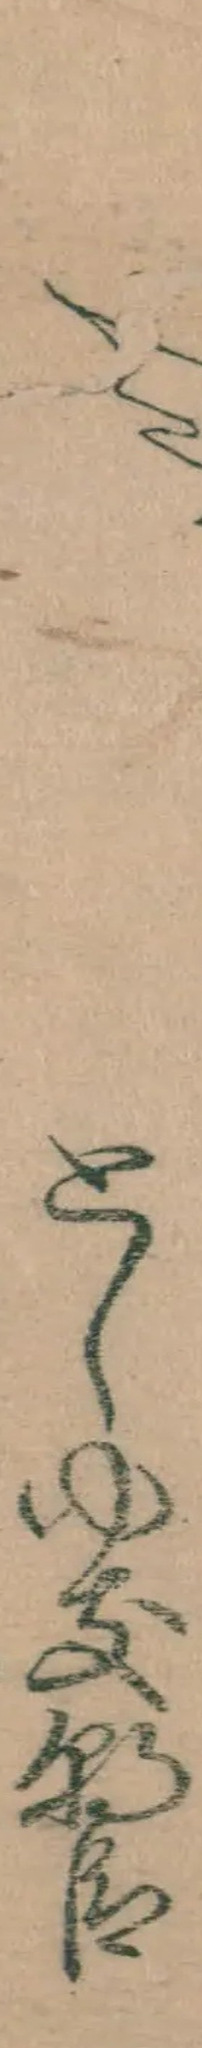としゆき朝臣
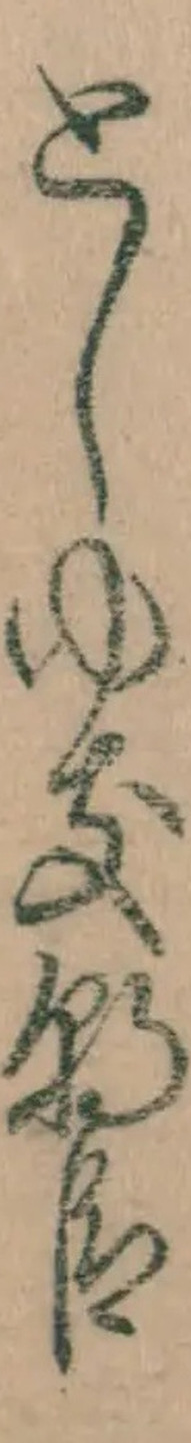としゆき朝臣
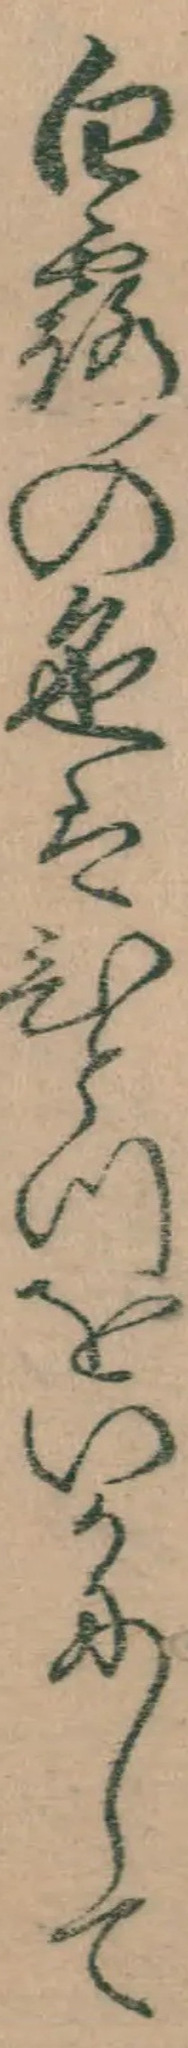白露の色はひとつをいかにして
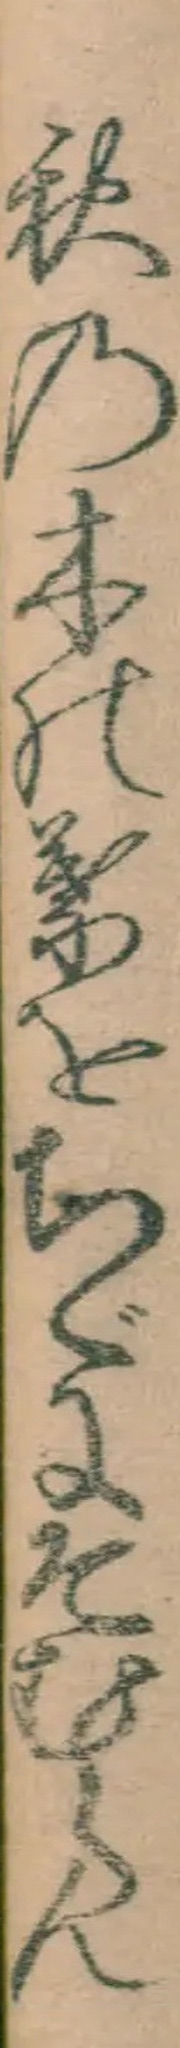秋の木の葉をちゞにそむらん
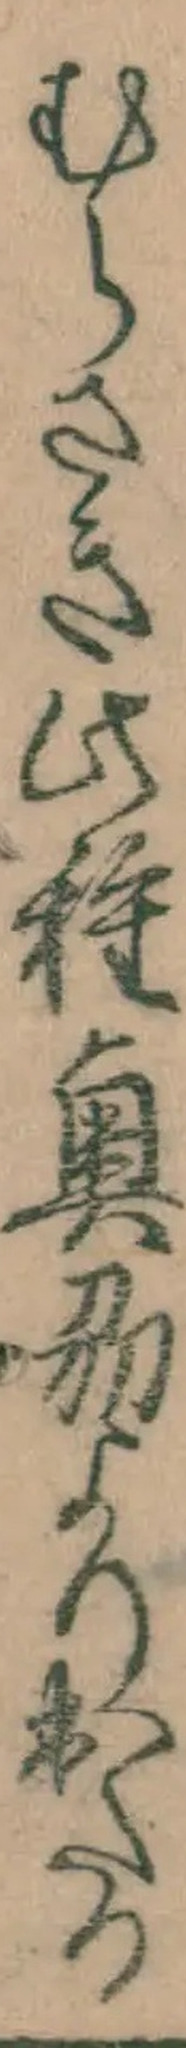むらさき此種奥州より出たる
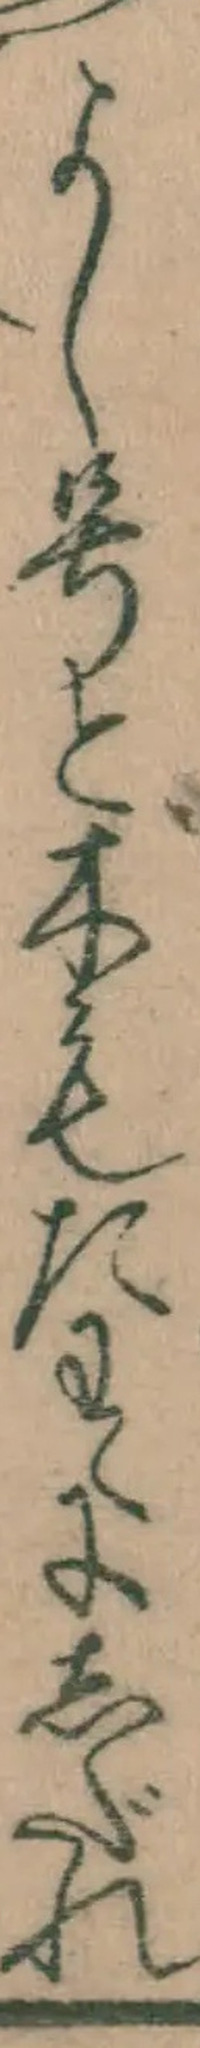よし号と木もたわゝにしだれ
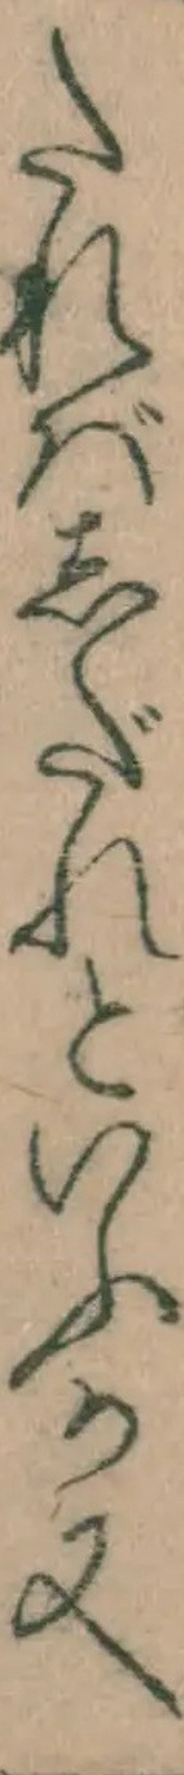たればしだれといふか又
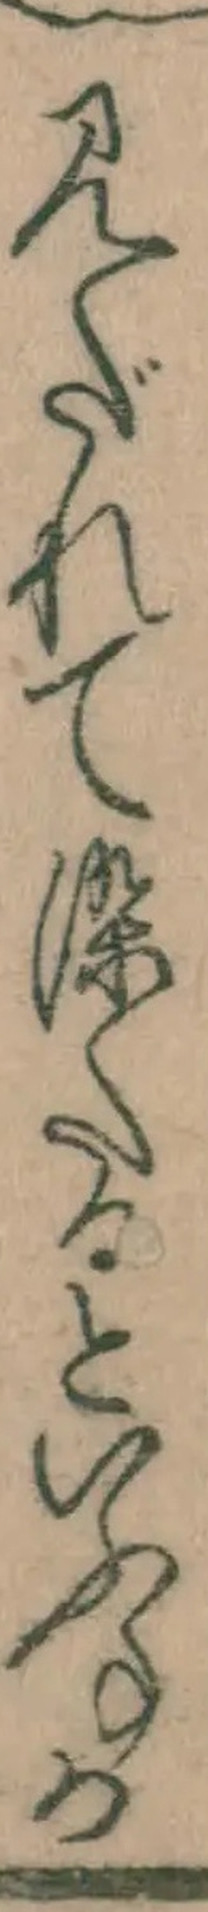みだれて染たるといふ事か
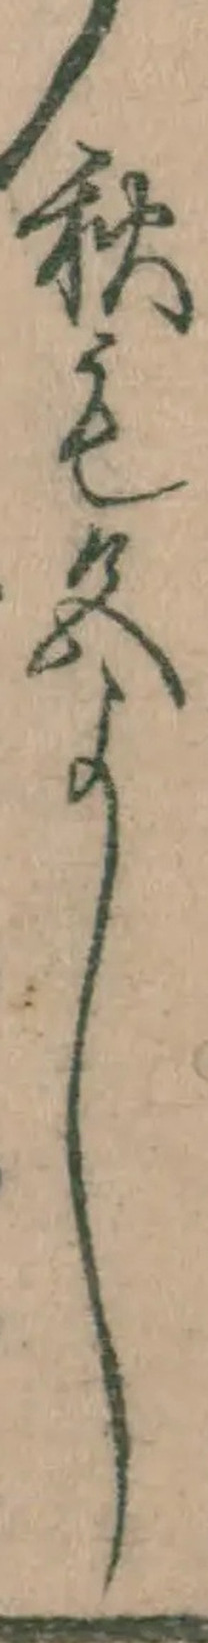秋も色よし
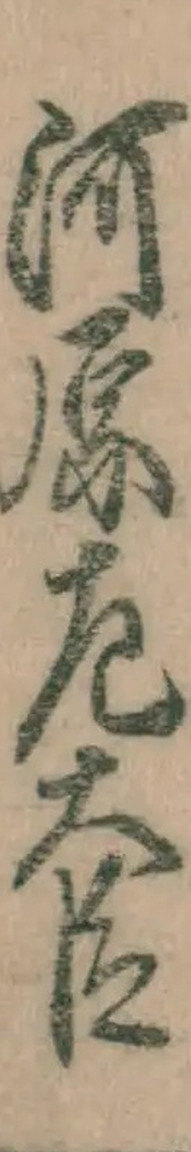河原左大臣
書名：紅葉集
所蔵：国立国会図書館 National Diet Library, JAPAN
